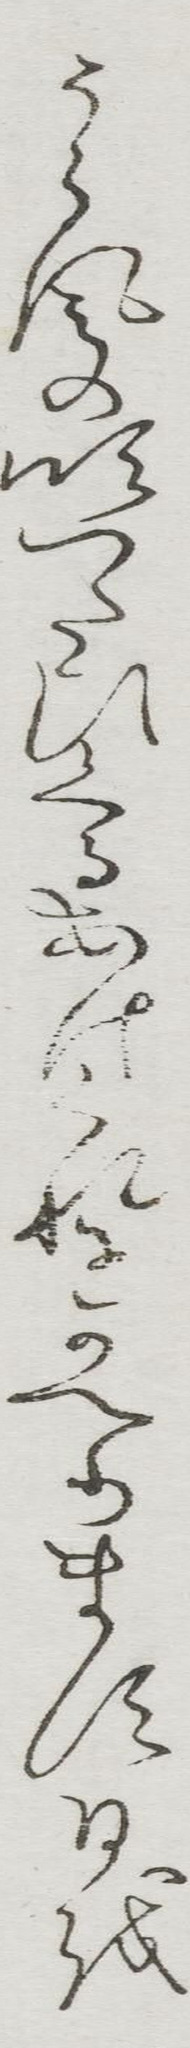うら風の吹つたひくるあけくれにかへります日を
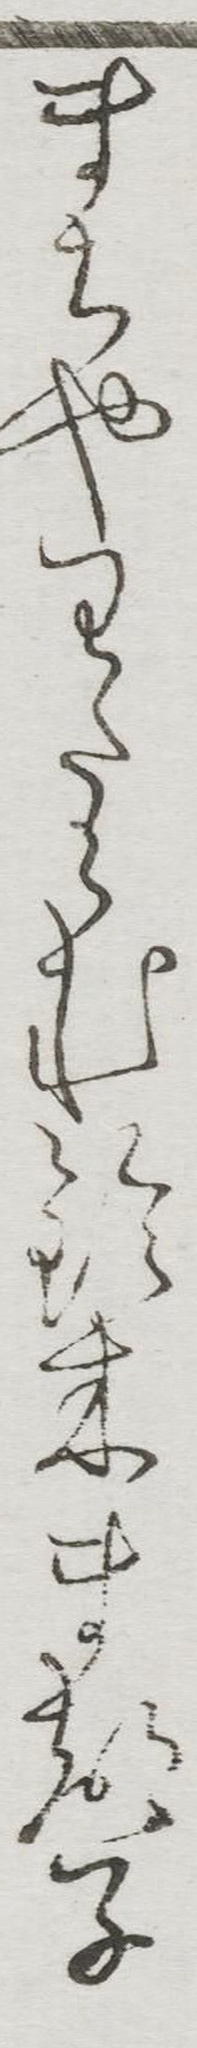まちやわたらむ鈴木まつ子
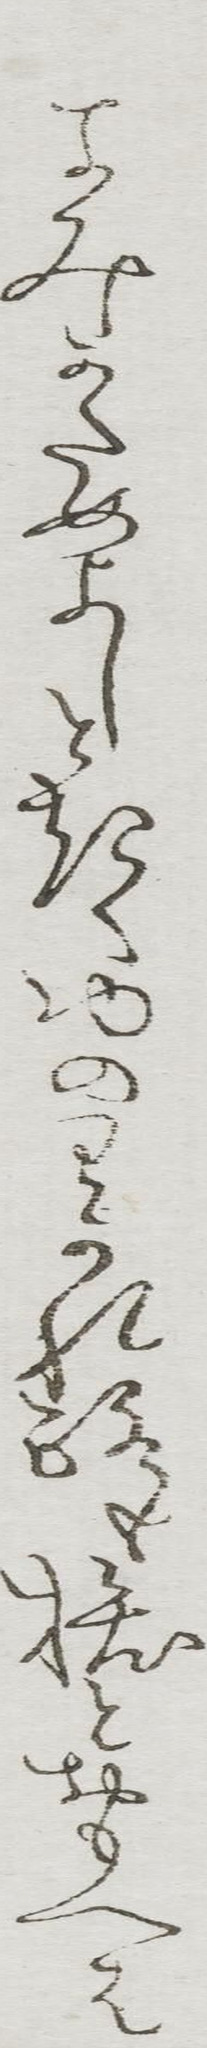きみかためよしときくゆのわかれ路も旅とおもへは
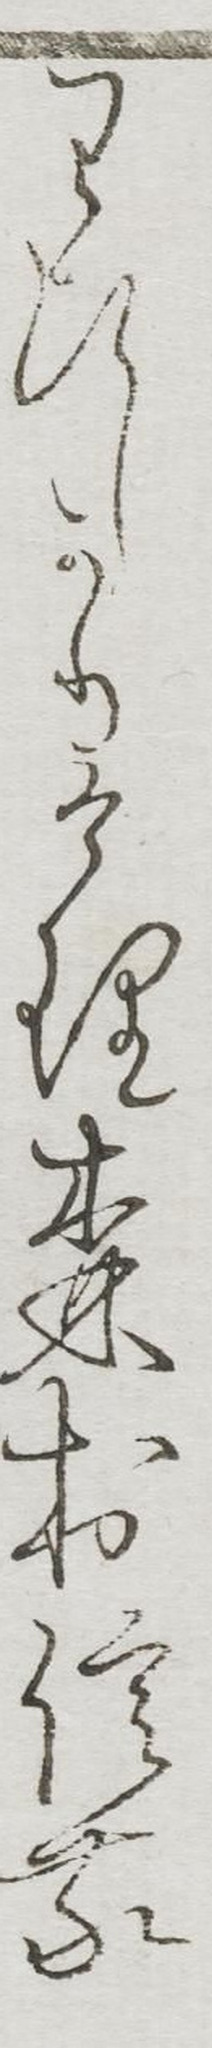わひしかりけり森村信家
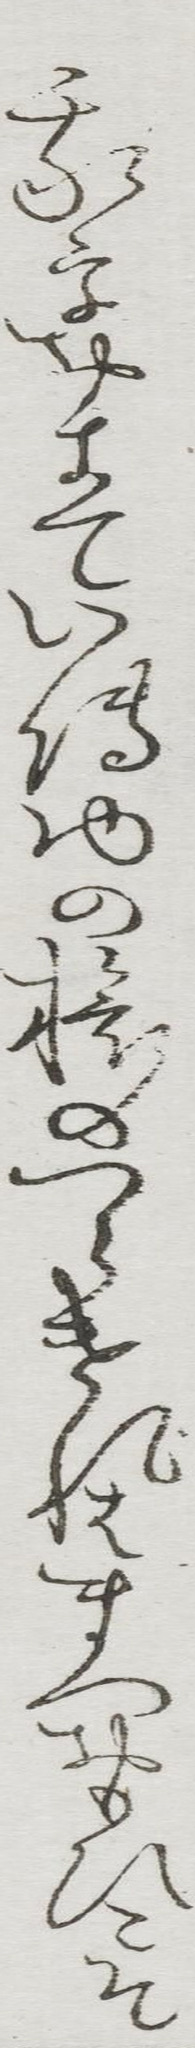我をおきていてゆの旅のつらけれはまつおもひこそ
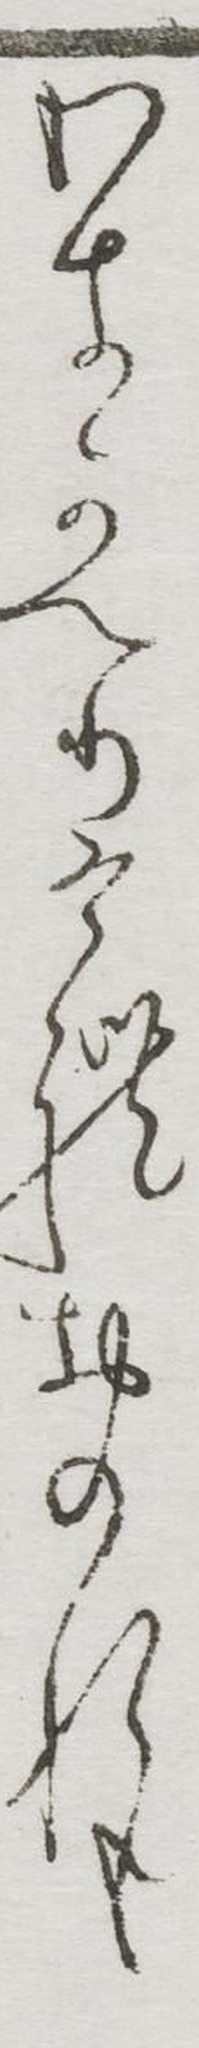わきかへりけれおのれも
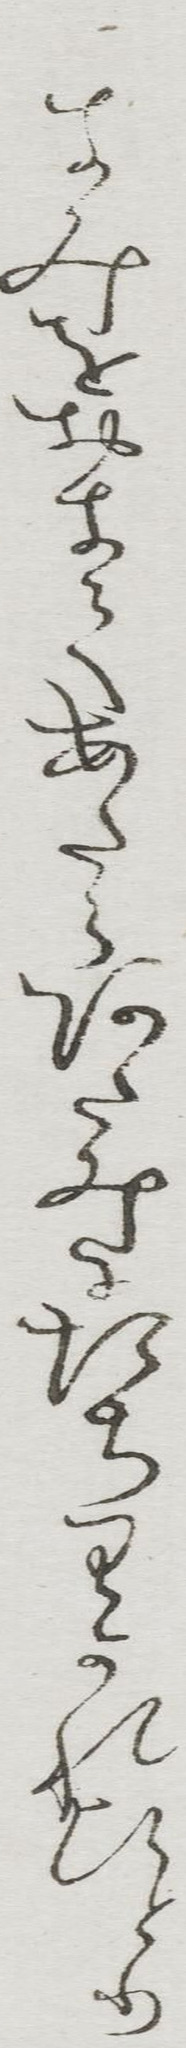きみをおきてあたらあたみにたちわかれひとり
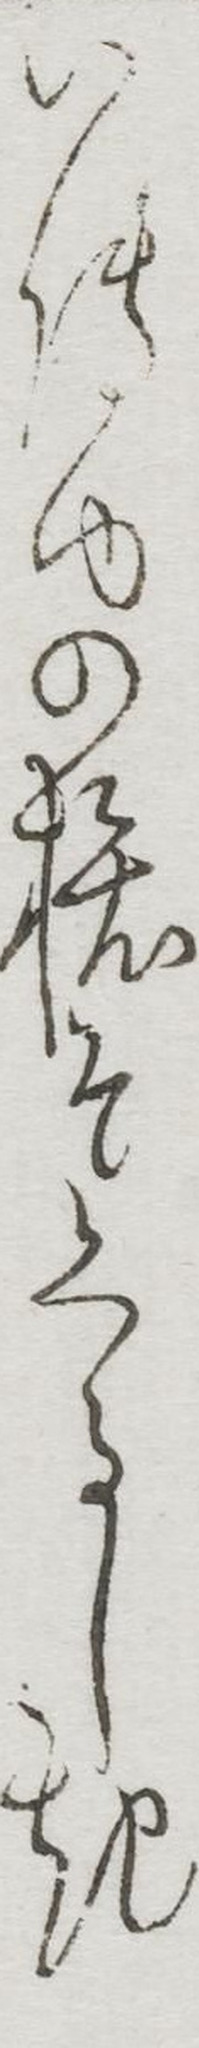いてゆの旅そくるしき
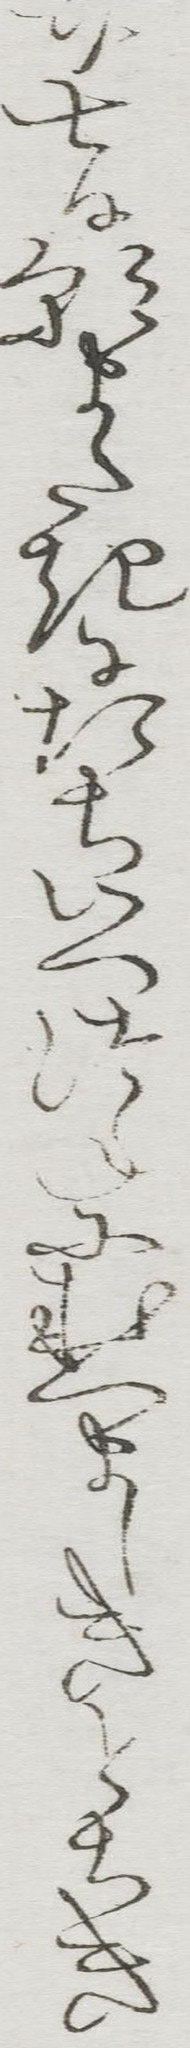廿七日朝またきにたちいつつねにむつましきとちき
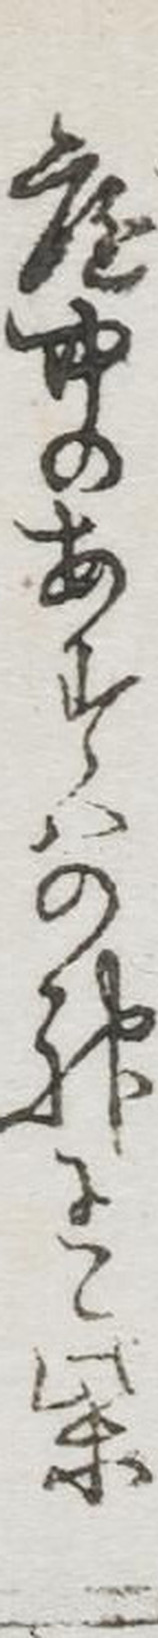庭中のあすはの神にて柴
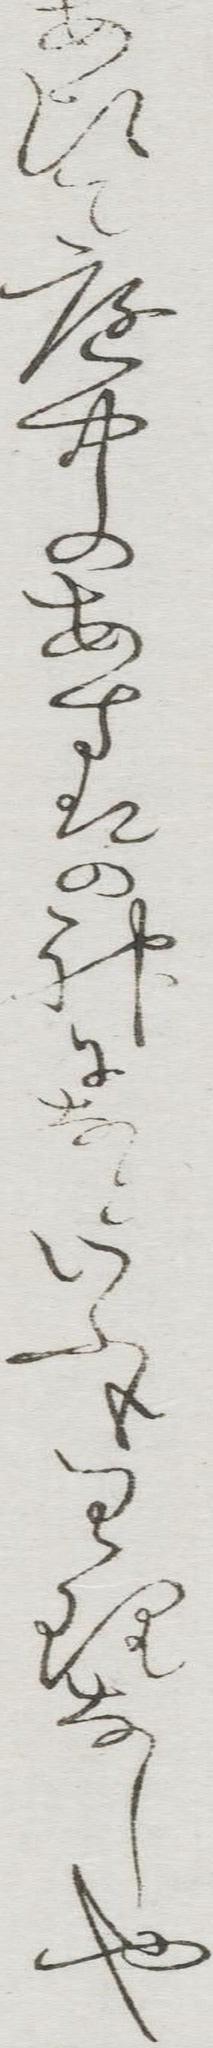あひて庭中のあすはの神になといふもわりなしや
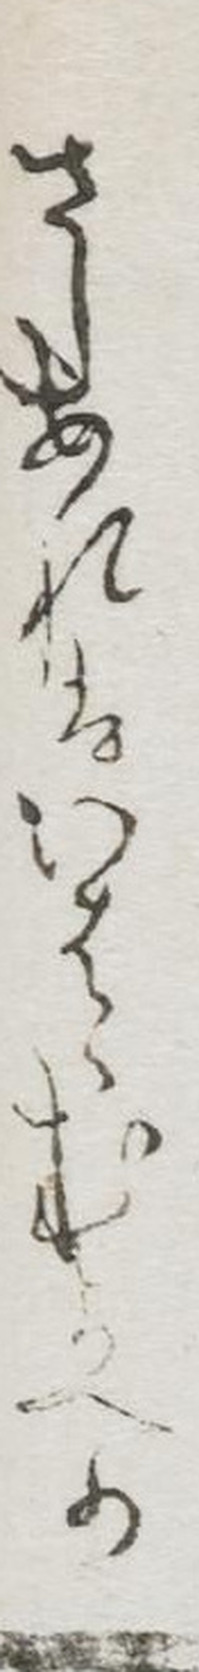さしあれはいはゝむかへり
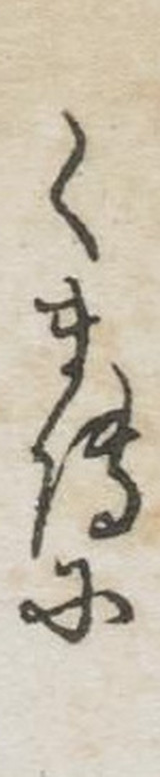くまてに
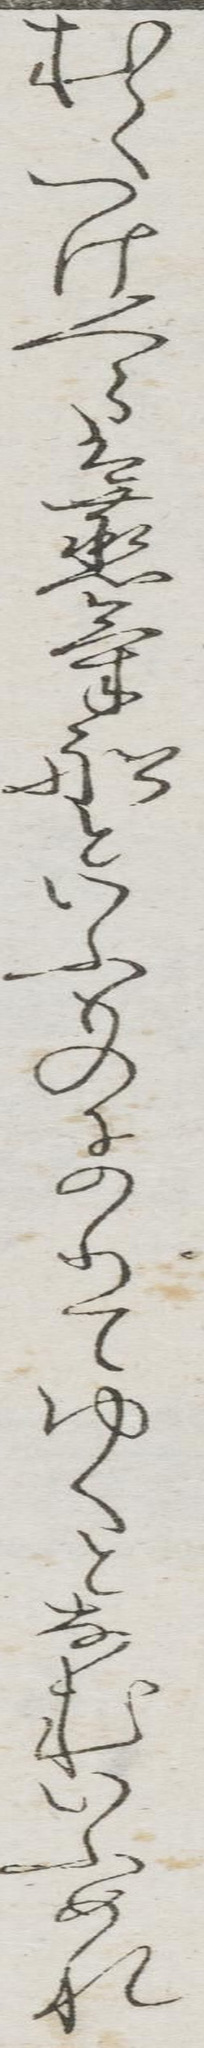むくつけ人々は蒸気船といふものにのりてゆくとなむいふめれ
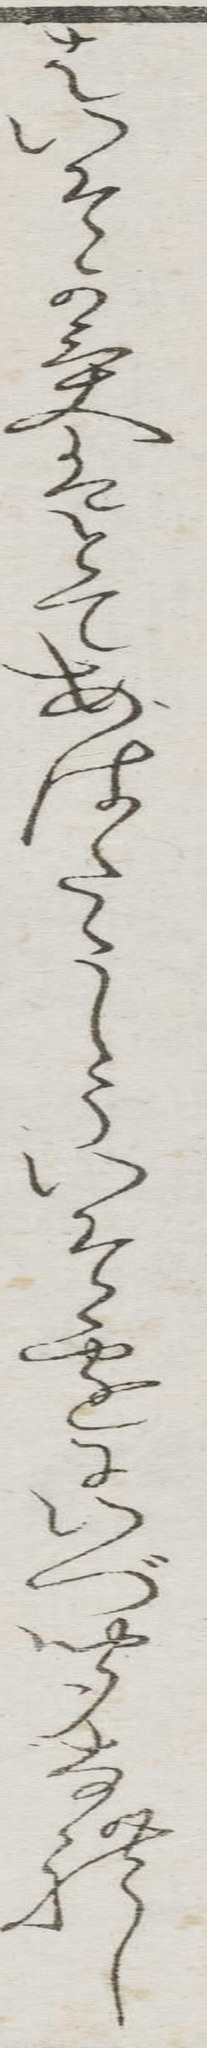はいそかすとてあはたゝしういそ辺にいづ聞なれし
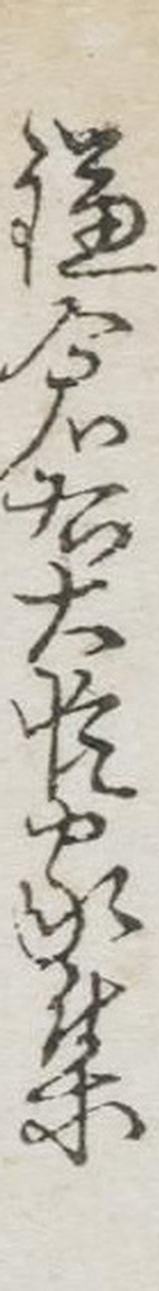鎌倉右大臣家集
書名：挿画熱海日記　全
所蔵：東京大学地震研究所図書室 Earthquake Research Institute Library, The University of Tokyo, JAPAN
